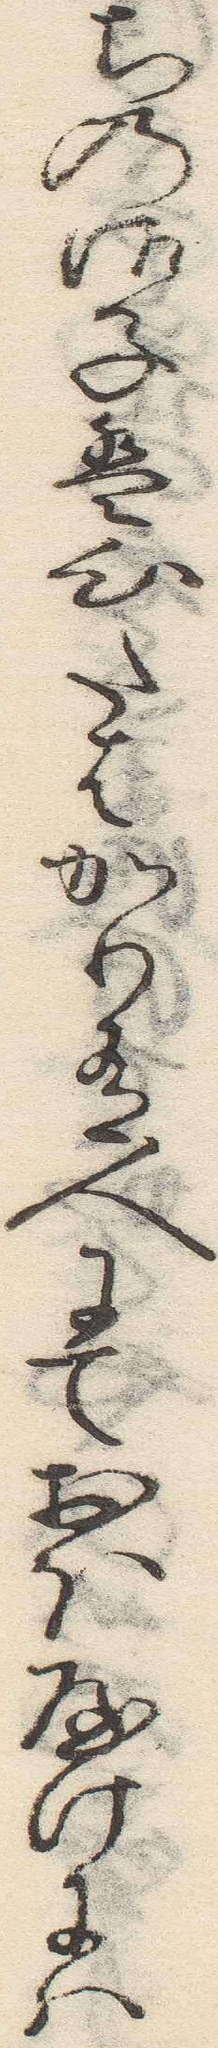ちの御子は心たはかり有人にておほやけには
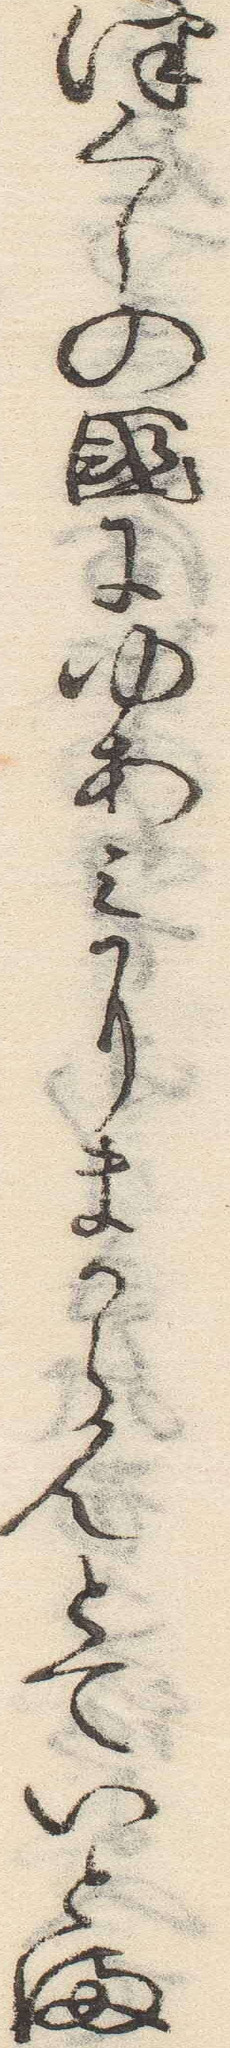つくしの国にゆあみにまからんとていとま
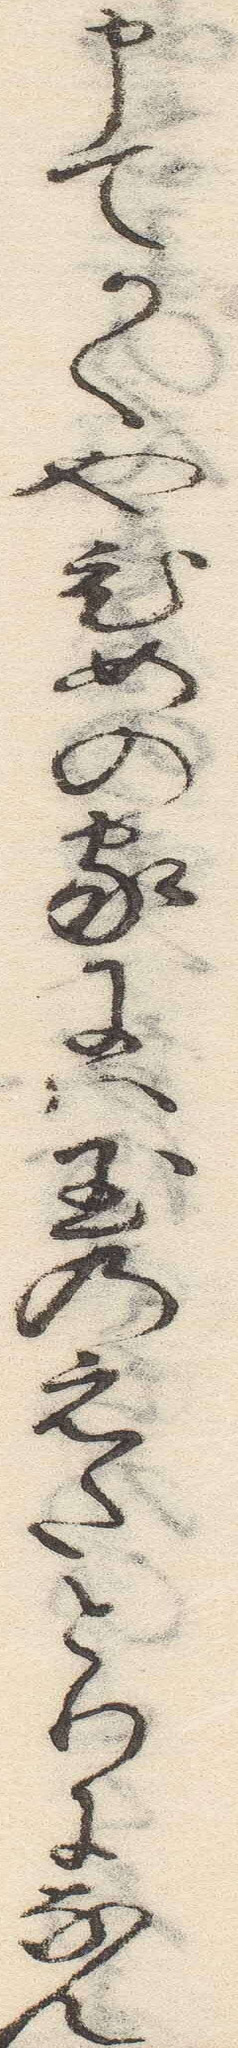申てかくやひめの家には玉のえたとりになん
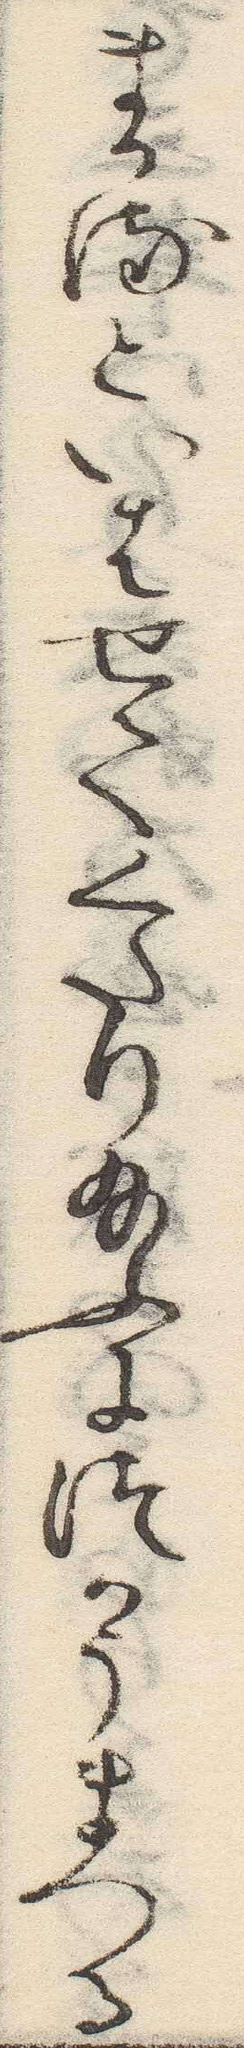まかるといはせてくたり給ふにつかうまつる
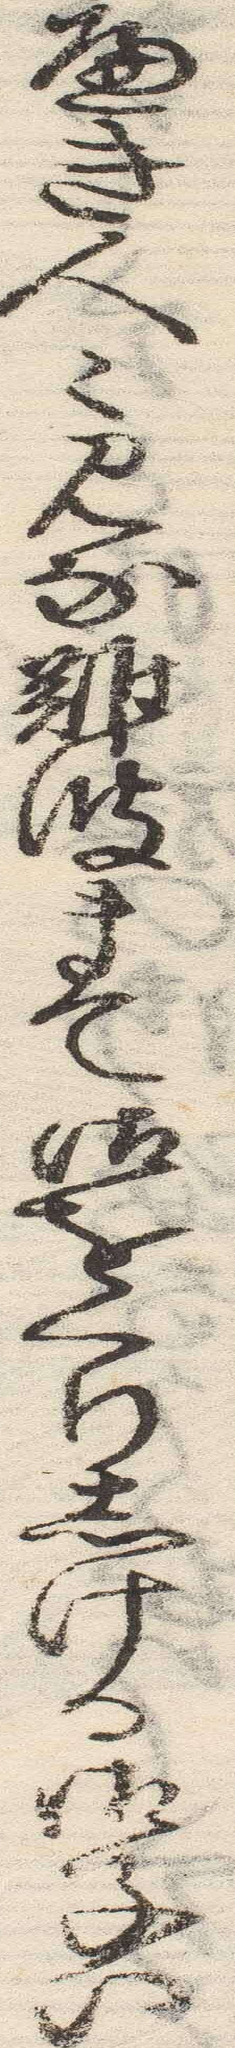へき人々みな難波まて御をくりしける御子い
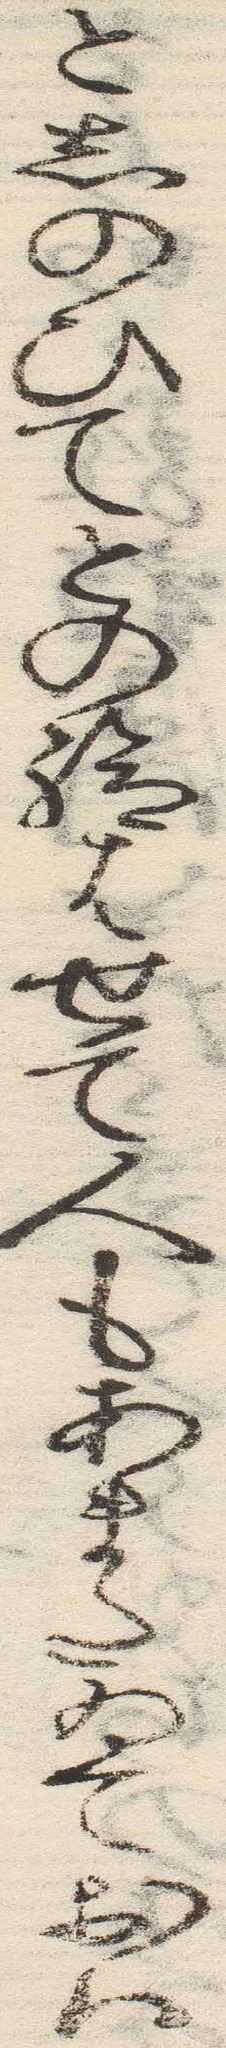としのひてとの給はせて人もあまたゐておは
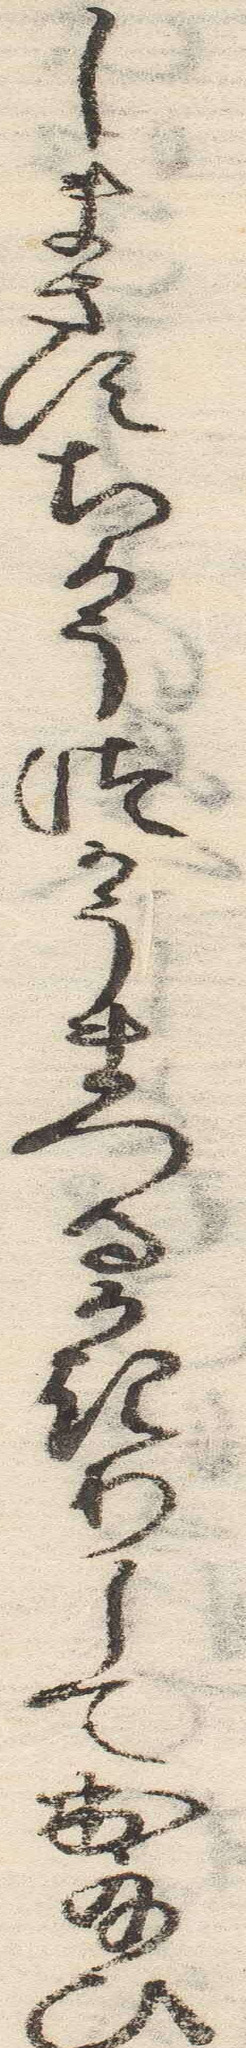しまさすちかうつかうまつるかきりして出給ひ
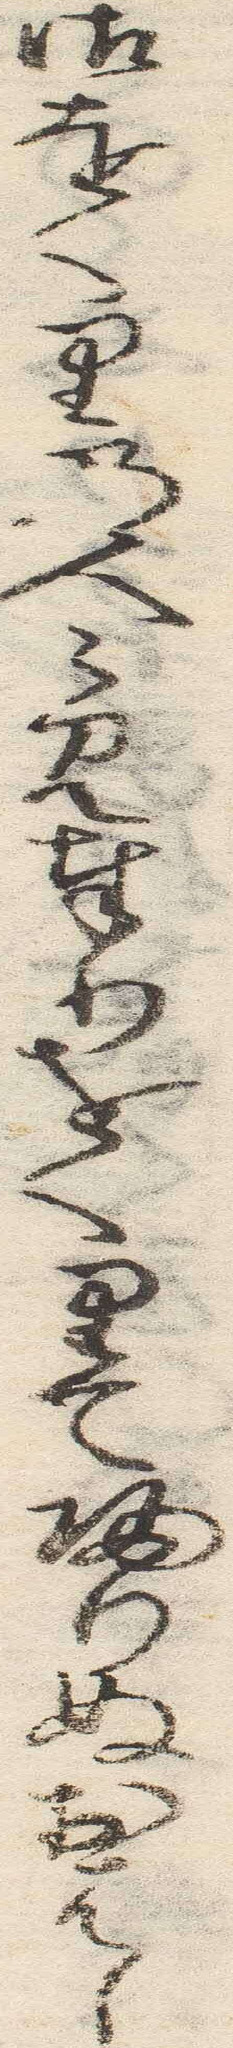御をくりの人々見奉りをくりて帰りぬおはし
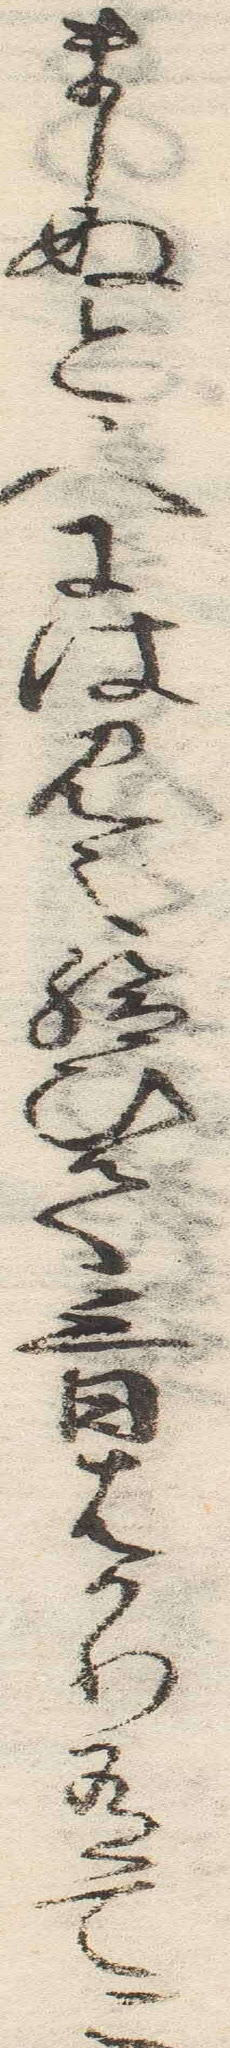ましぬと人には見え給ひて三日はかり有てこ
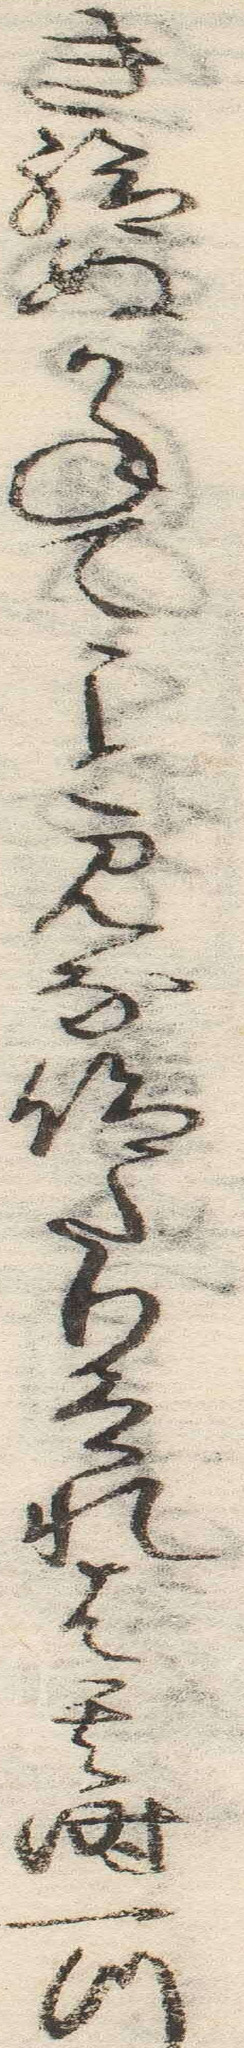き給ぬかねてことみな仰たりけれは其時一つ
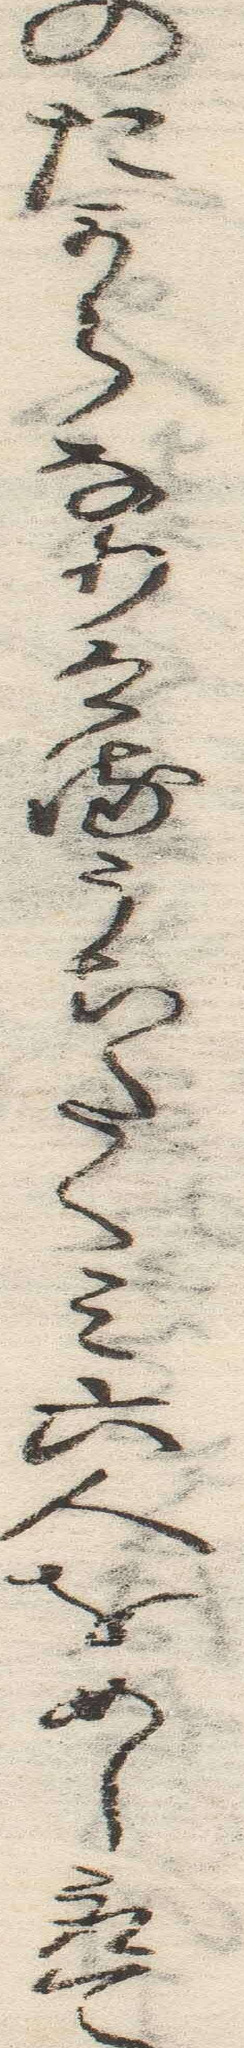のたからなりけるうちたくみ六人をめし取て
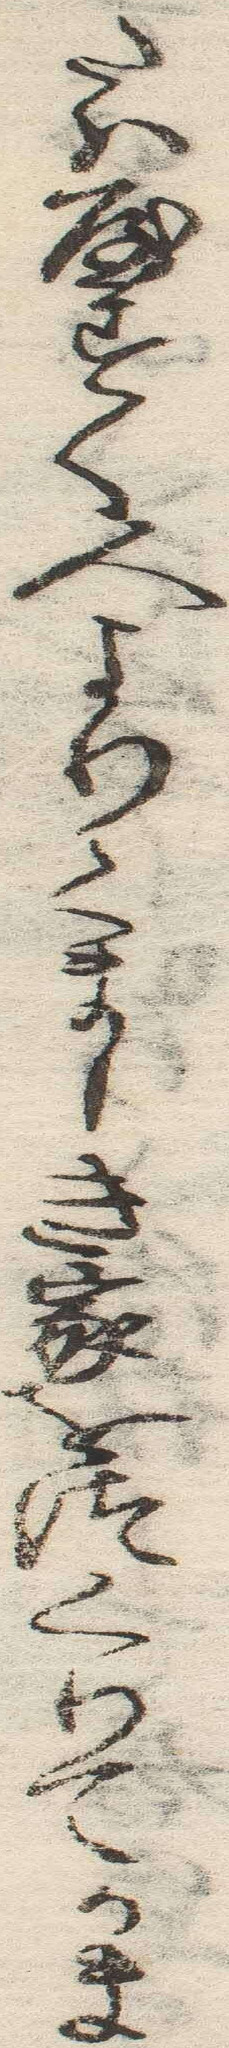たはやすく人よりくましき家をつくりてかま
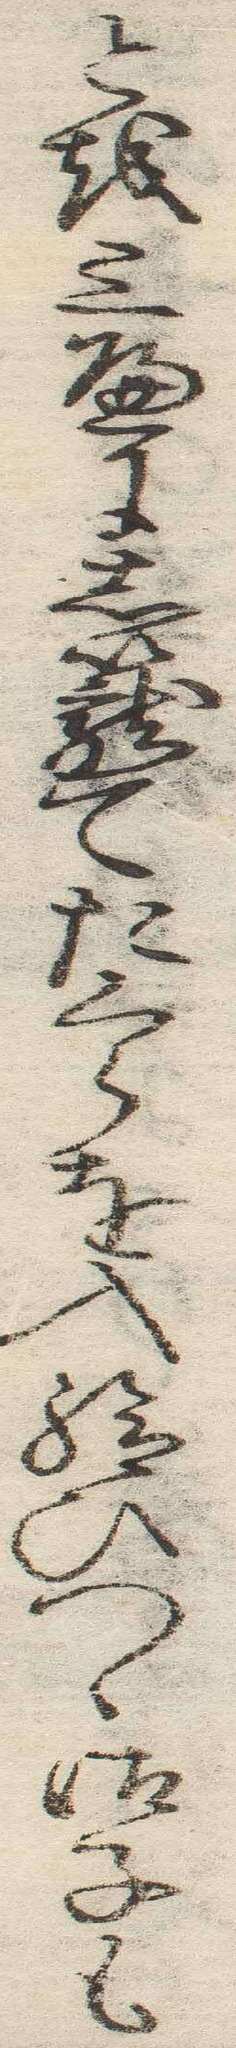とを三へにし籠てたくらを入給ひつゝ御子も
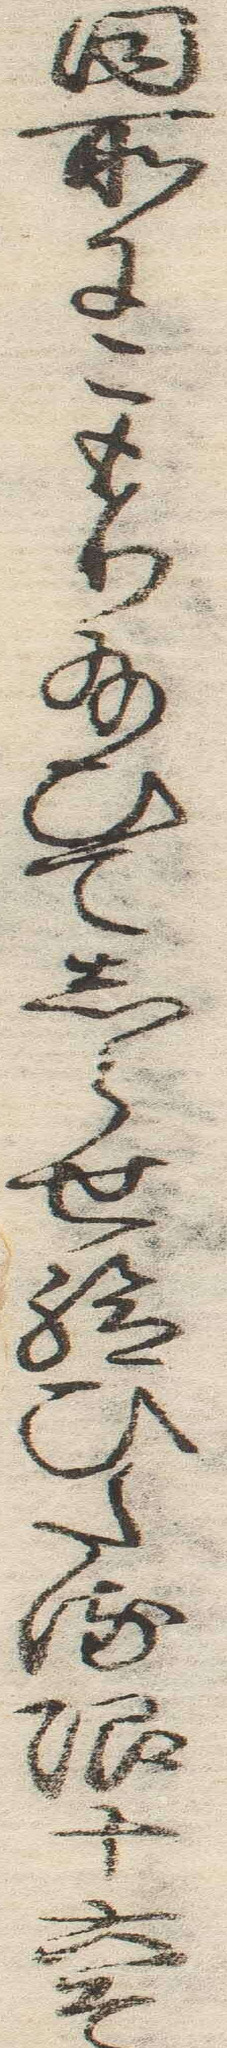同所にこもり給ひてしらせ給ひたる限十六そ
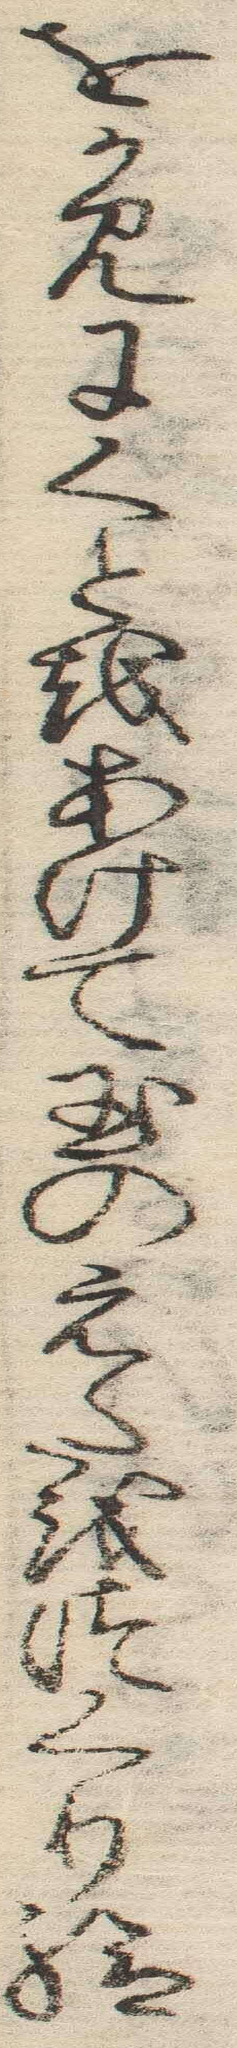をかみにくとをあけて玉のえたをつくり給

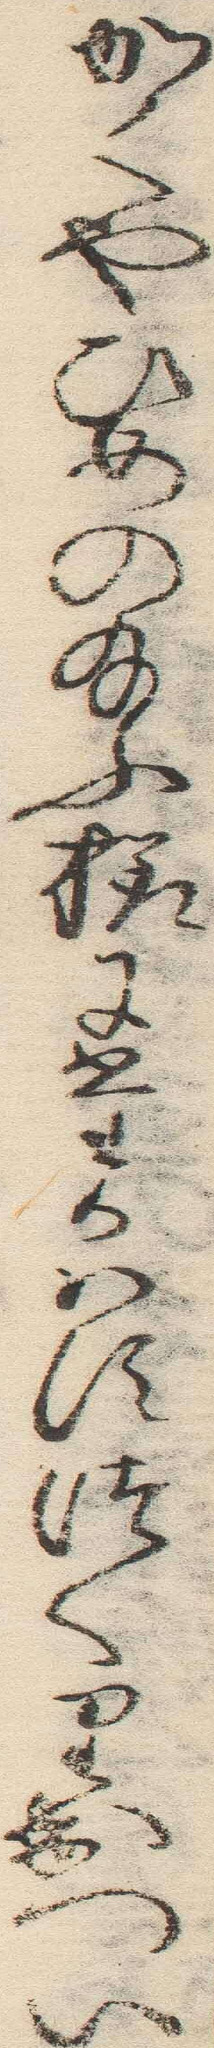かくやひめの給ふ様にたかはすつくり出つい
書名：竹取物語
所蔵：東京学芸大学附属図書館 国文学研究資料館
